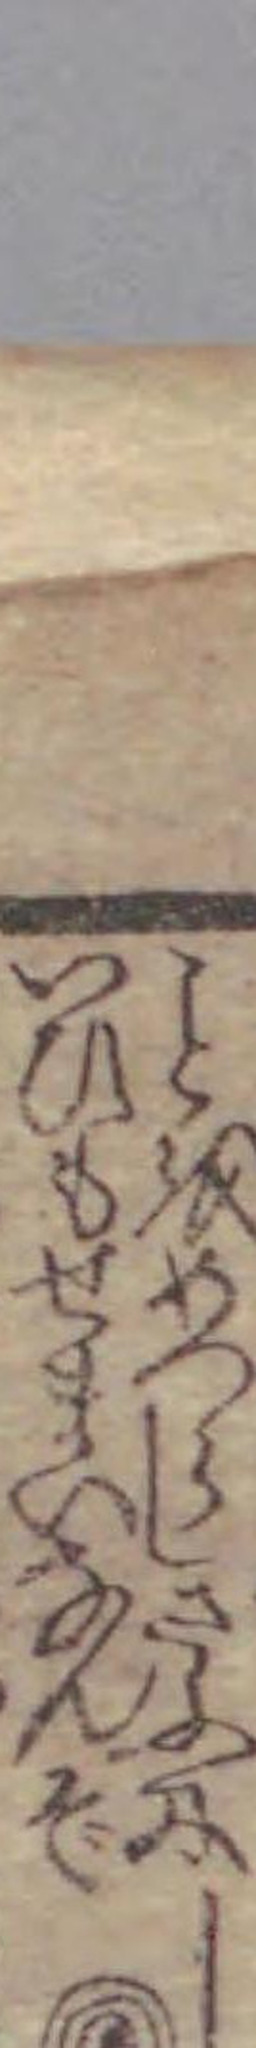いひもせまいなんぞ
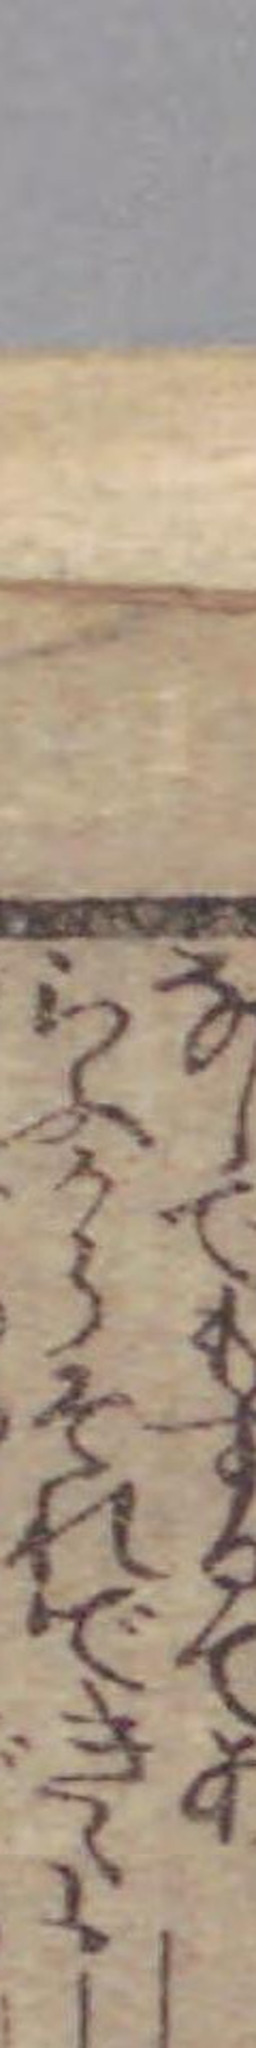らふからそれできゝに
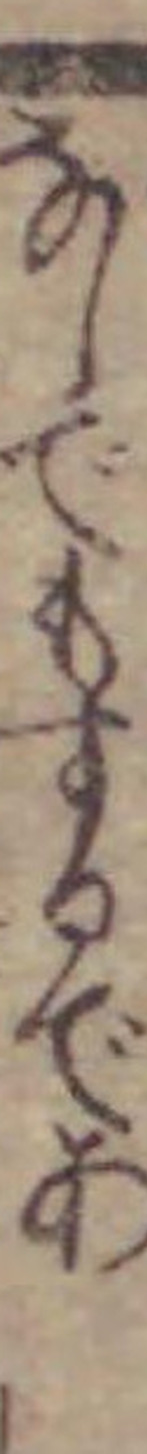なしでもするであ
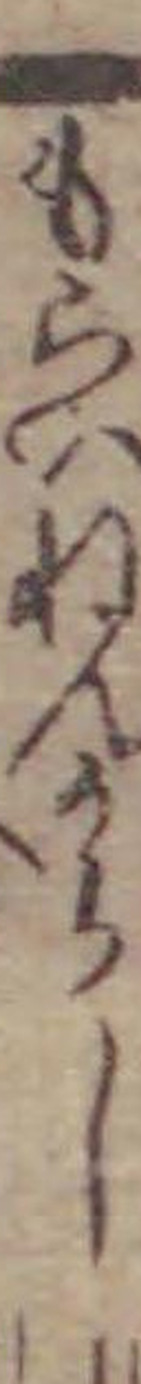もらいねんからし
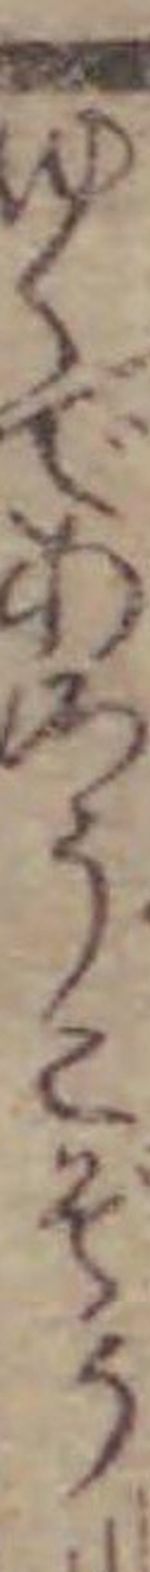ゆくであろうこぞう
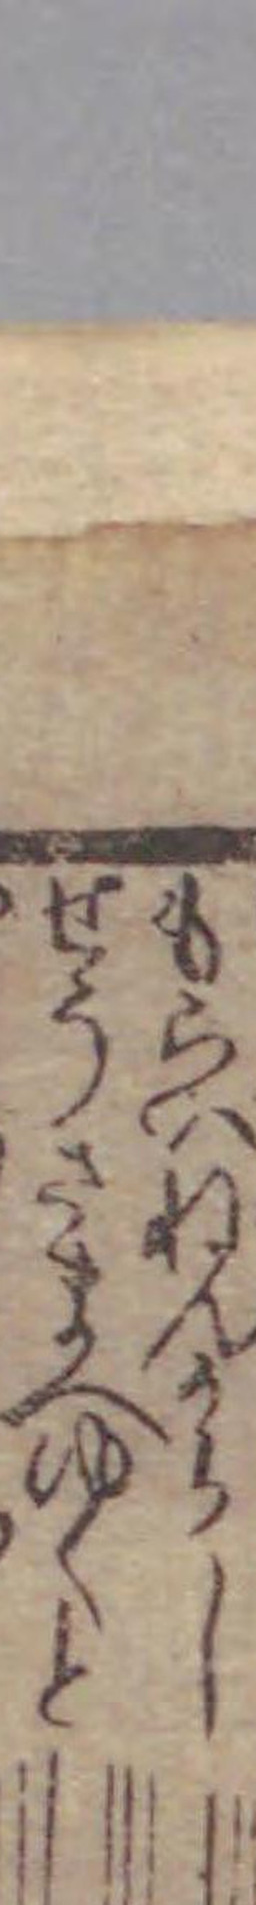せうさまへゆくと
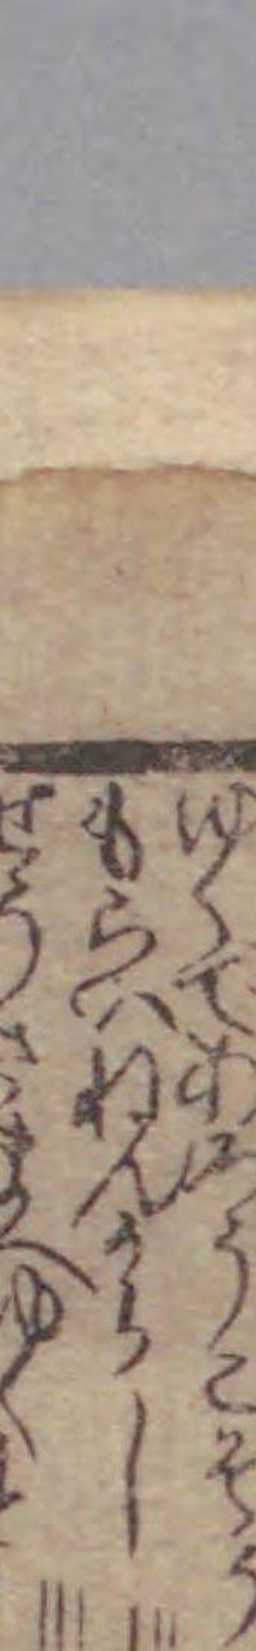もらいねんからし
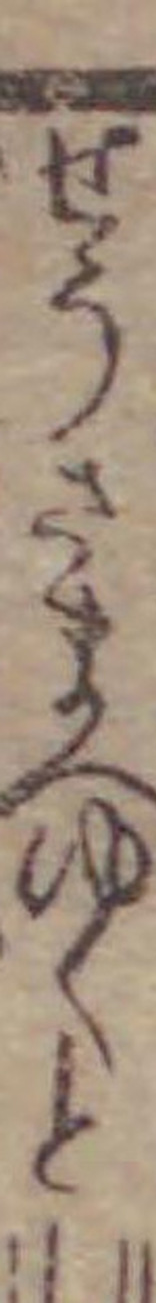せうさまへゆくと
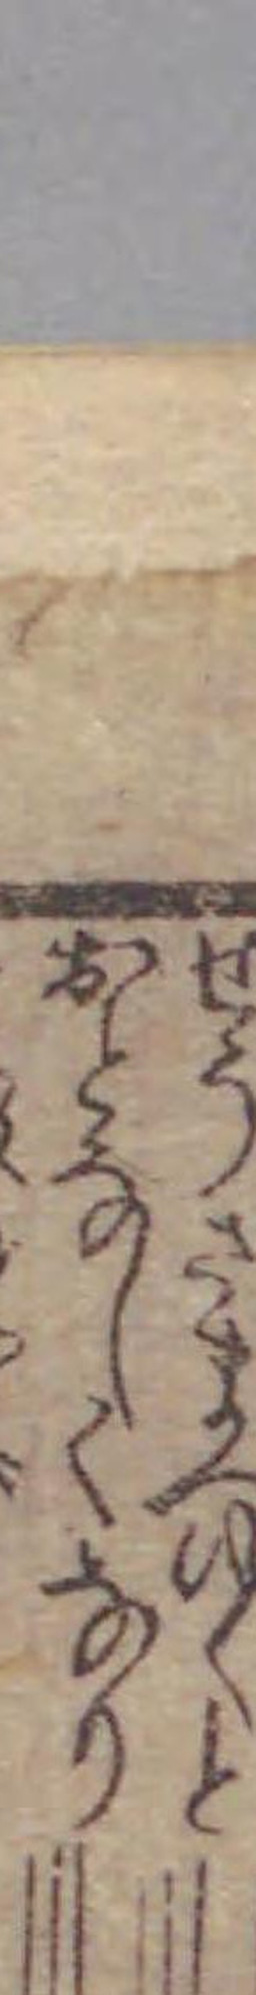おとなしくなり
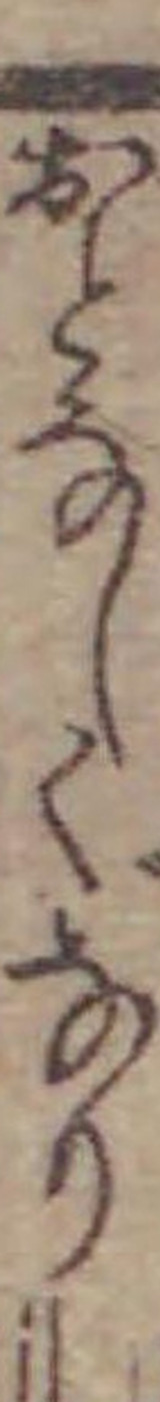おとなしくなり
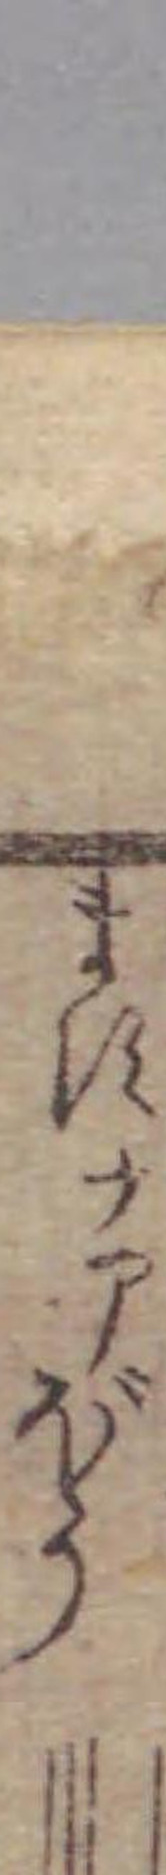ますナアぼう
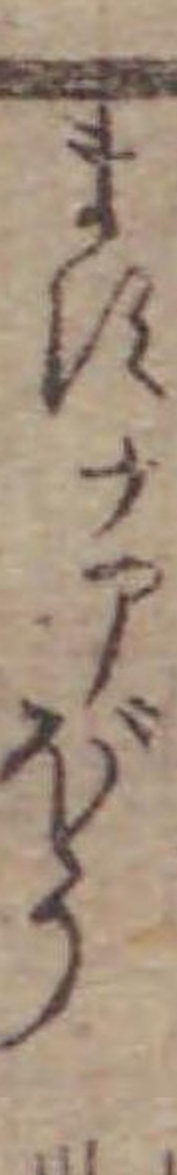ますナアぼう

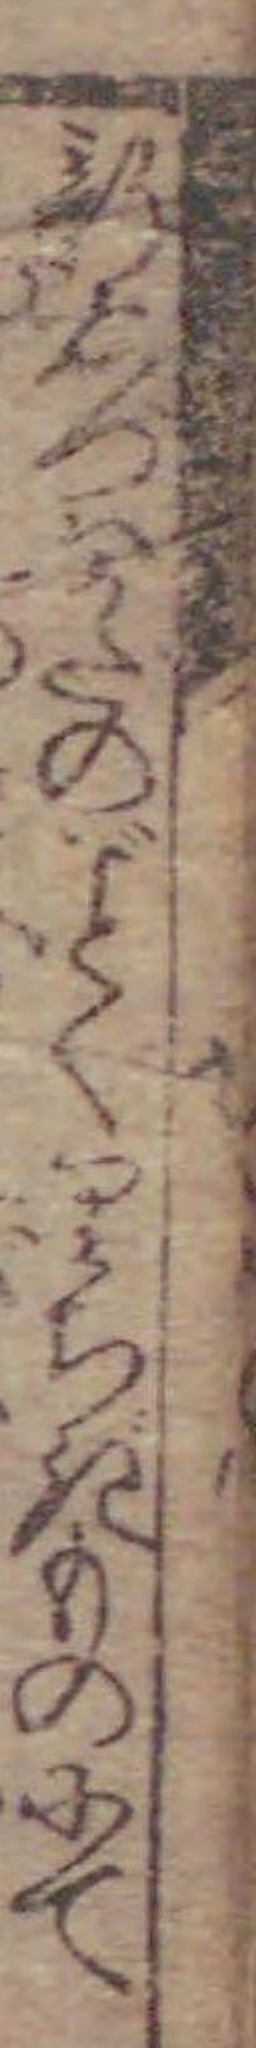新右衛門はかたのごとくりちぎものにて
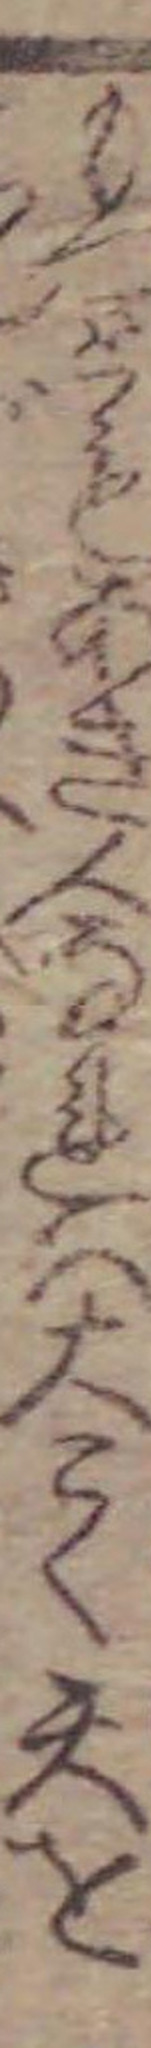もつともあき人なれば大こく天を
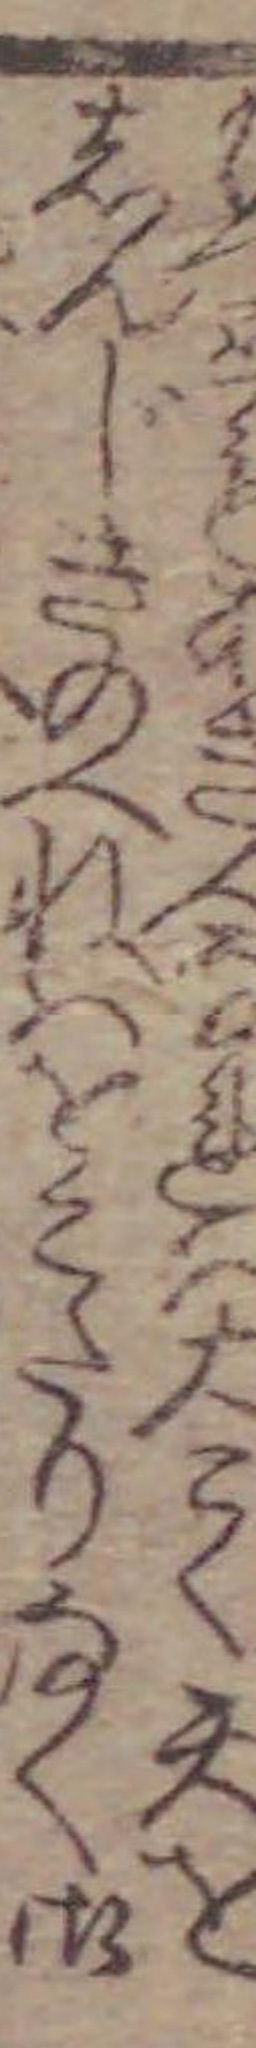しんじきのへねはをこたりなく御
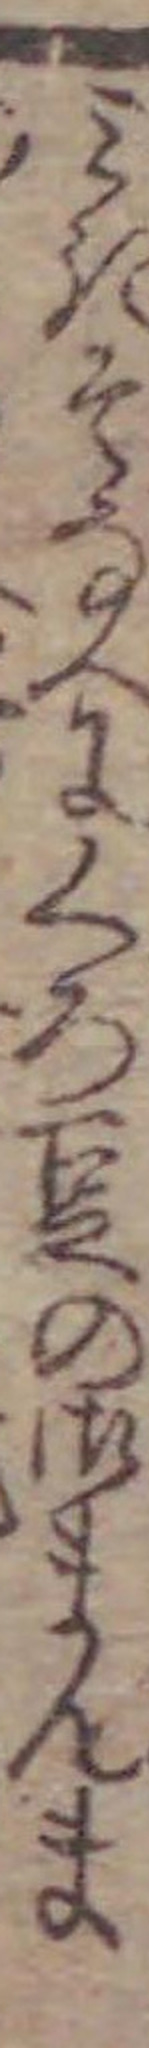みきそなへにくろ豆の御まんま
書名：即席耳学問 : 3巻
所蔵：国立国会図書館 National Diet Library, JAPAN
